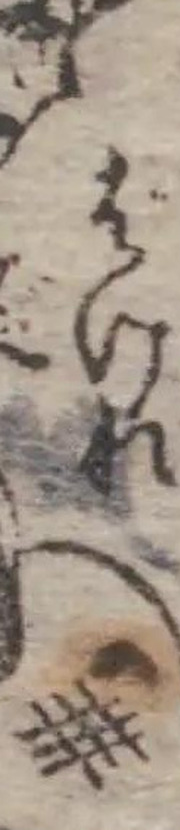ばけれ
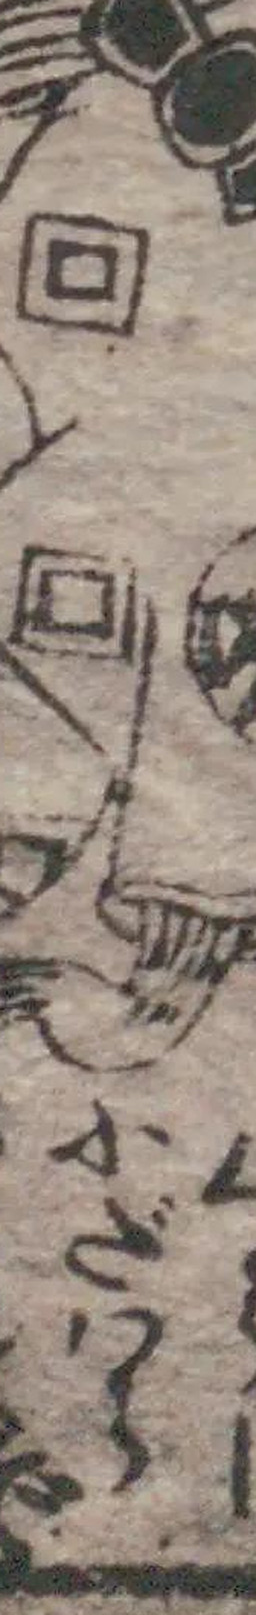小だはら
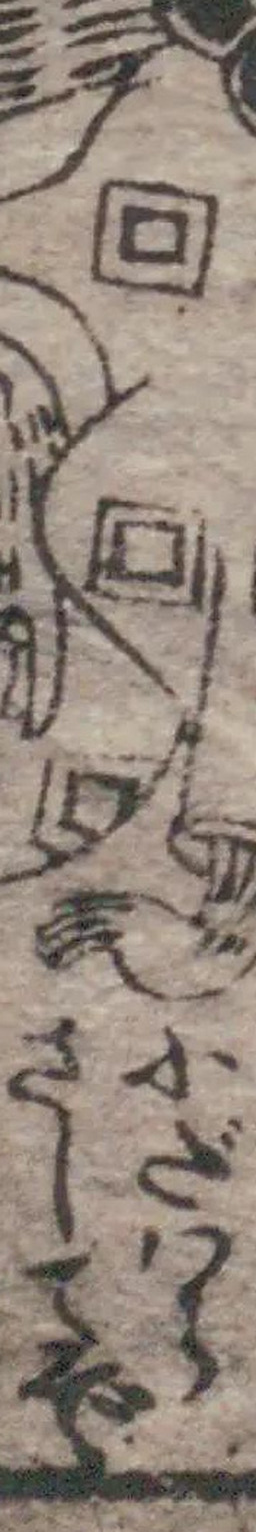さしてぞ
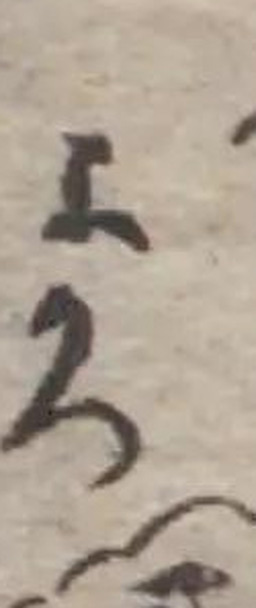よかつ
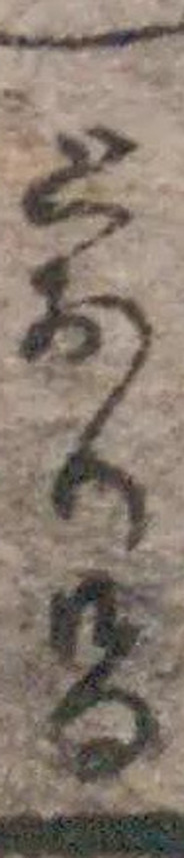とおりける
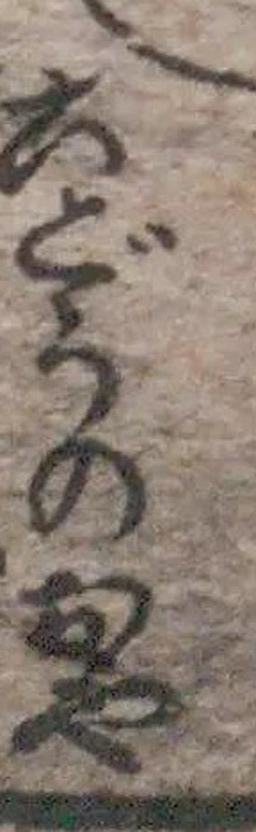六どうのおや
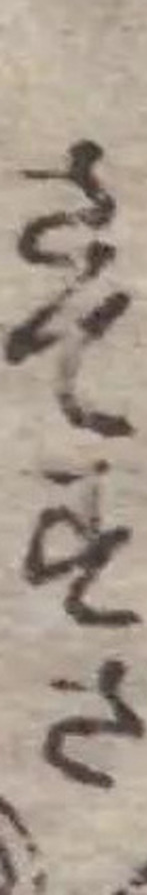さてすざ
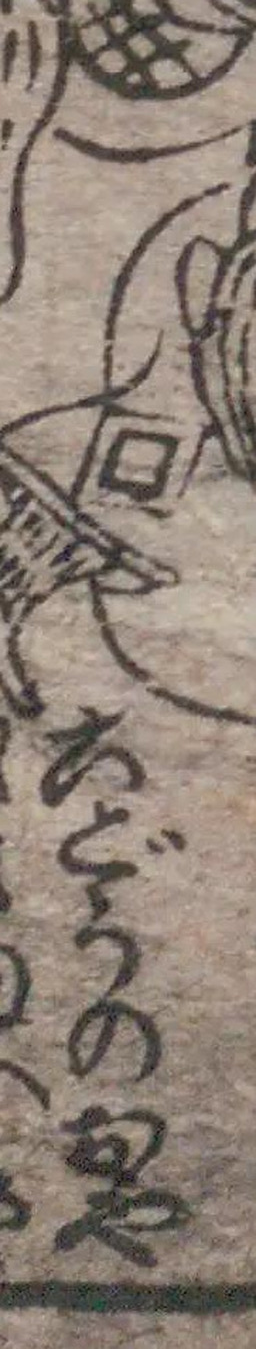六どうのおや
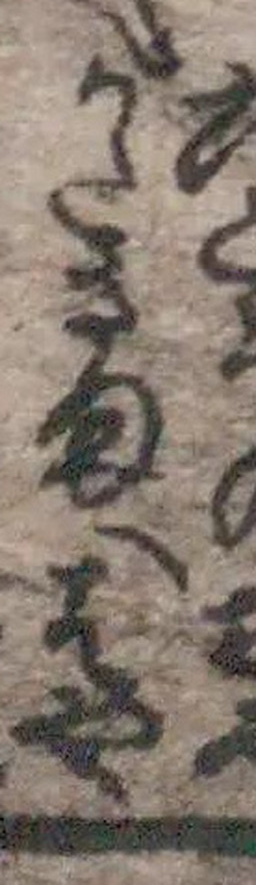かたさまへはや
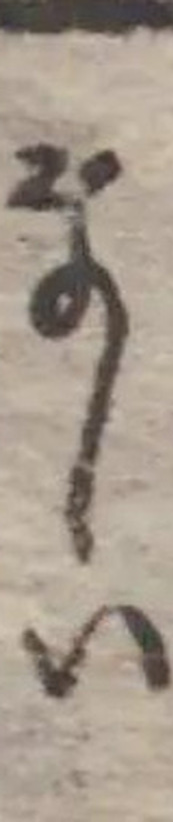ましい
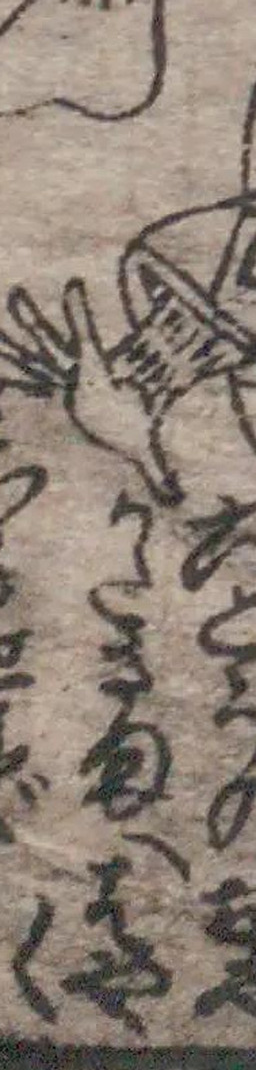かたさまへはや
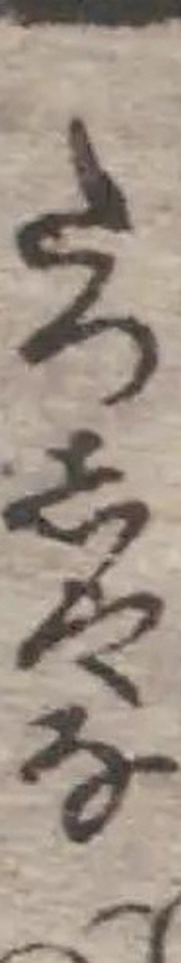たつしやな
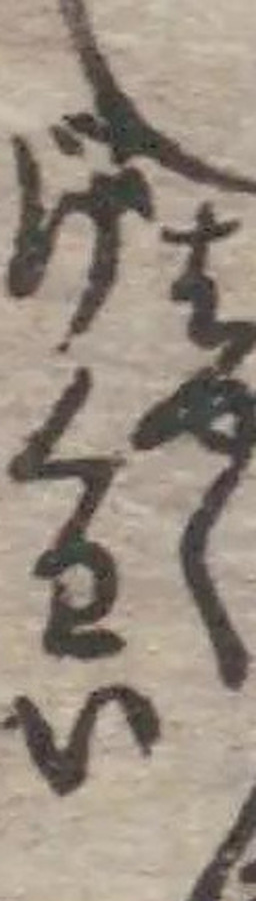げくわい
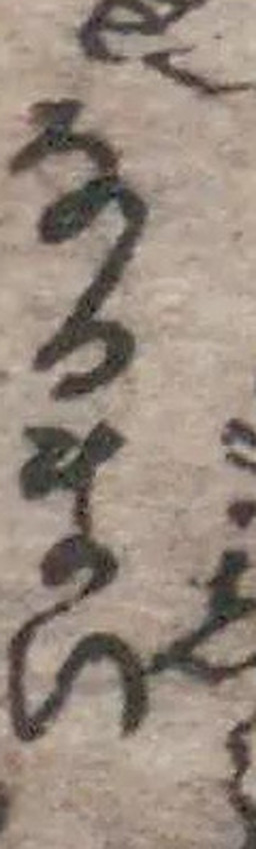なるまい
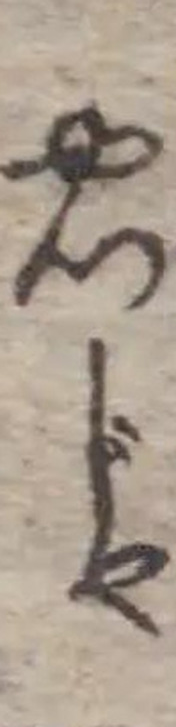やつじや
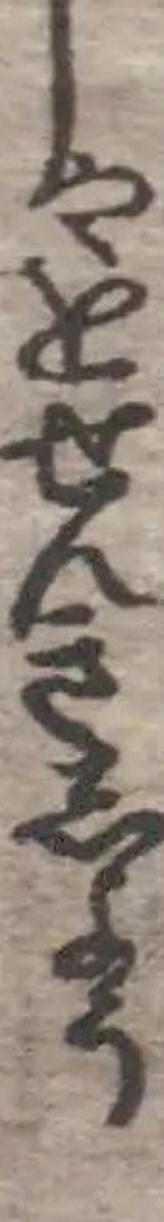しやをせんきしよう
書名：大磯地蔵咄 2巻
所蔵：国立国会図書館 National Diet Library, JAPAN
